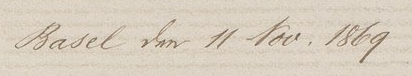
Basel den 11 Nov. 1869
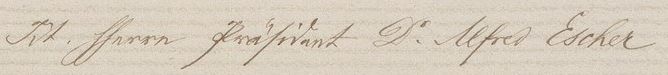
Tit. HHerrn Präsident Dr Alfred Escher
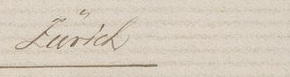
Zürich
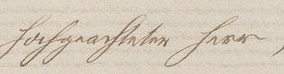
Hochgeachteter Herr,
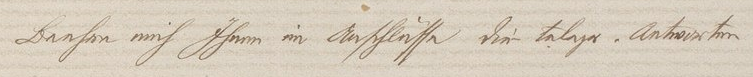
Beehre mich Ihnen in Anschlusse die telegr. Antworten
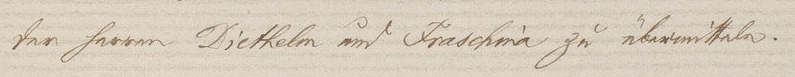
der Herren Diethelm und Fraschina zu übermitteln.
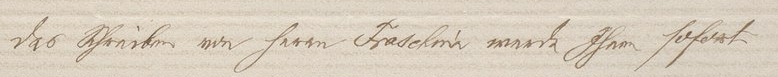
Das Schreiben von Herrn Fraschina werde Ihnen sofort
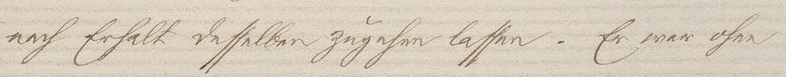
nach Erhalt desselben zugehen lassen. Er war ohne
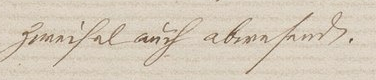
Zweifel auch abwesend.
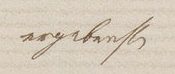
ergebenst
